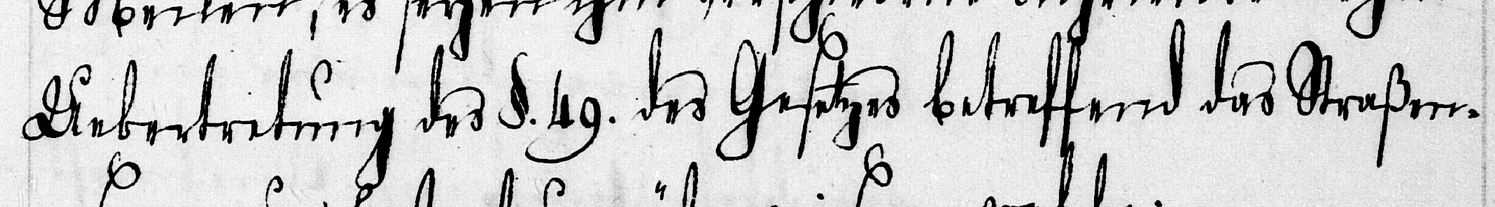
Uebertretung des §. 49. des Gesetzes betreffend das Straßen¬
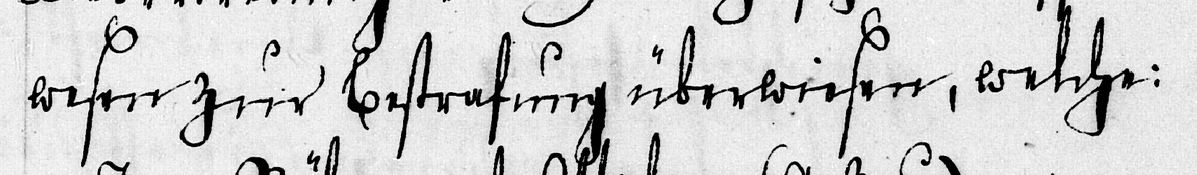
wesen zur Bestrafung überwiesen, welche:
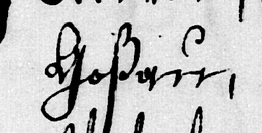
Goßau,
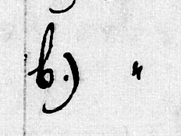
b.)
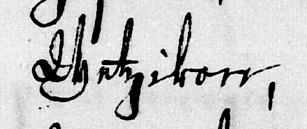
Wetizkon,
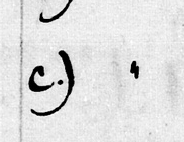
d.)
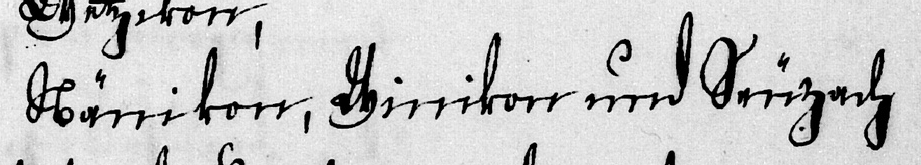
Nänikon, Winikon und Seuzach
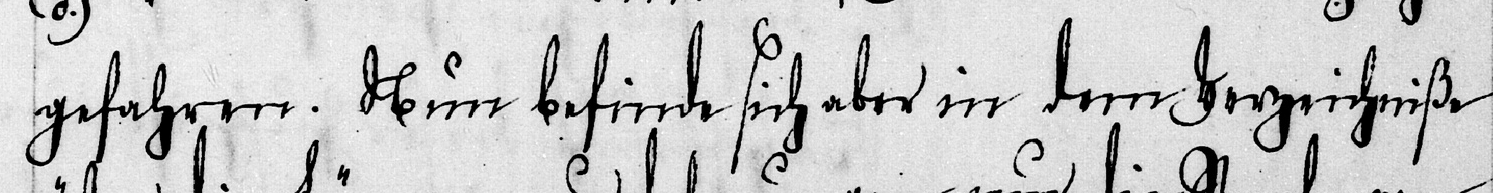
gefahren. Nun befinde sich aber in dem Verzeichniße
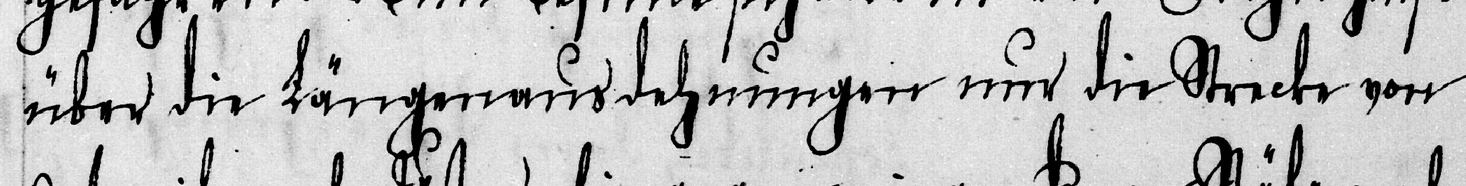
über die Längenausdehnungen nur die Strecke von
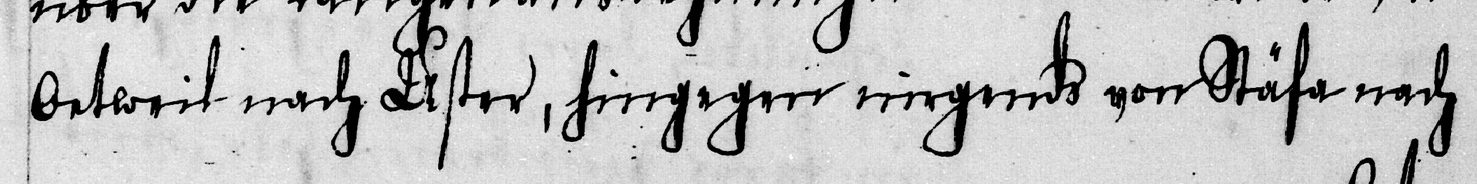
Oetweil nach Uster, hingegen nirgends von Stäfa nach
